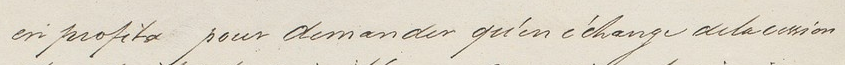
en profita pour demander qu'en échange de la cession
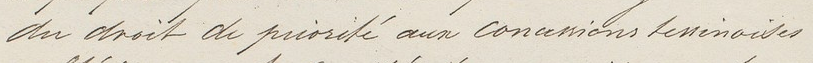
du droit de priorité aux Concessions tessinoises
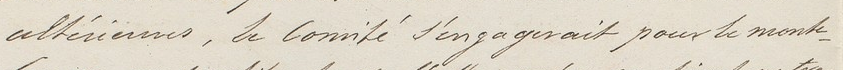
ultérieures, le Comité s'engagerait pour le Monte
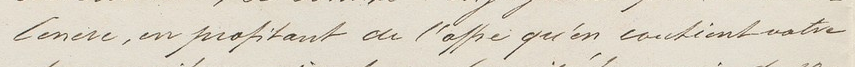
Cenere, en profitant de l'offre qu'en contient votre
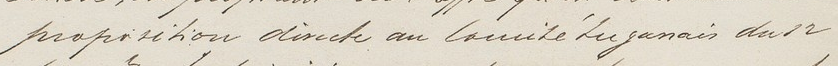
proposition directe au Comité Luganais du 12
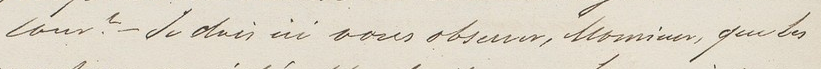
Court. – Je dois ici vous observer, Monsieur, que les
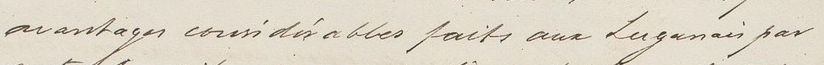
avantages considérables faits aux Luganais par
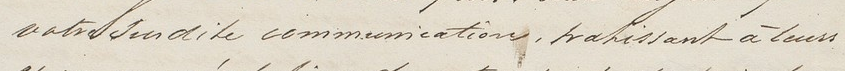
votre susdite communication, trahissant à leurs
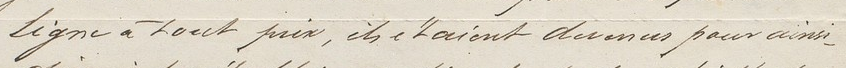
ligne à tout prix, ils étaient devenus pour ainsi
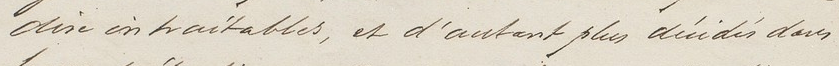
dire intraitables, et d'autant plus décidés dans
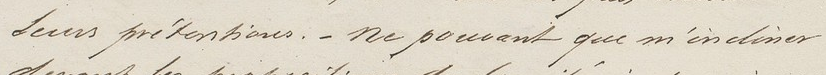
leurs prétentions. – Ne pouvant que m'incliner
